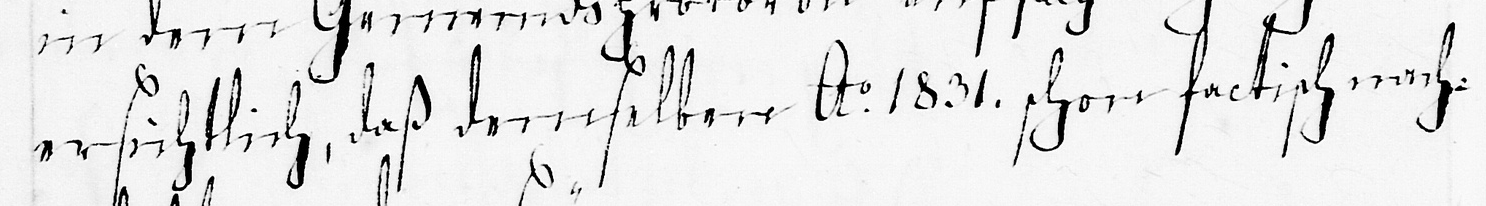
ersichtlich, daß demselben Ao. 1831 schon factisch nach¬
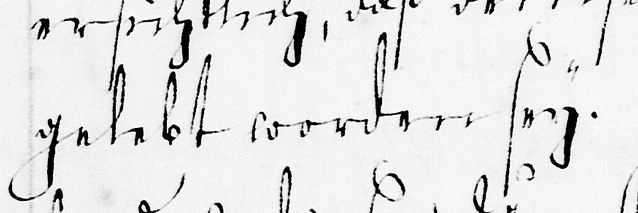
gelebt worden sey.
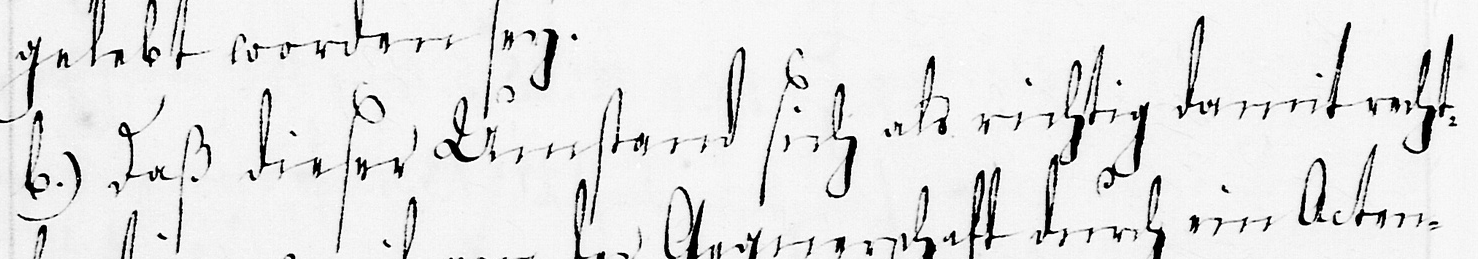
b.) Daß dieser Umstand sich als richtig damit rech¬
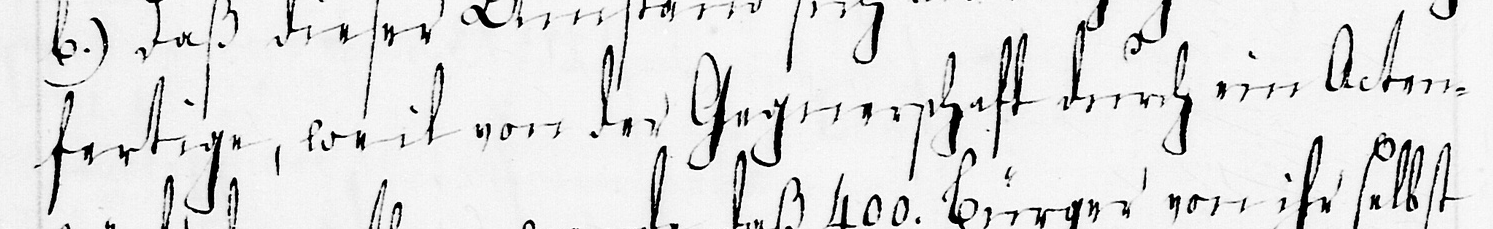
tfertige, weil von der Gegnerschaft durch ein Acten¬
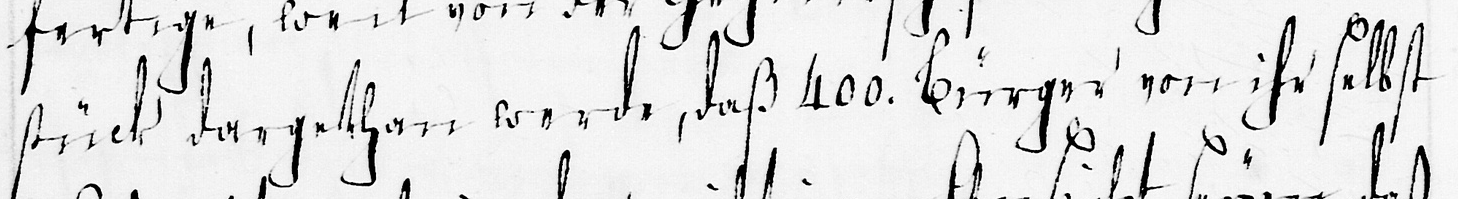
stück dargethan werde, daß 400. Bürger von ihr selbst
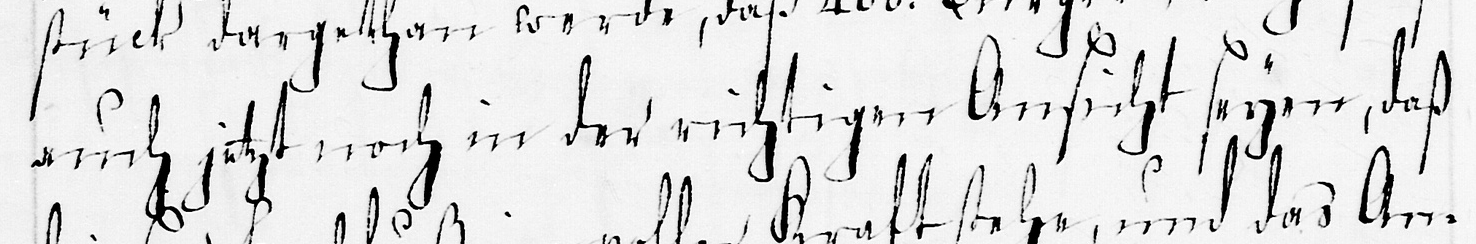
auch jetzt noch in der richtigen Ansicht seyen, daß
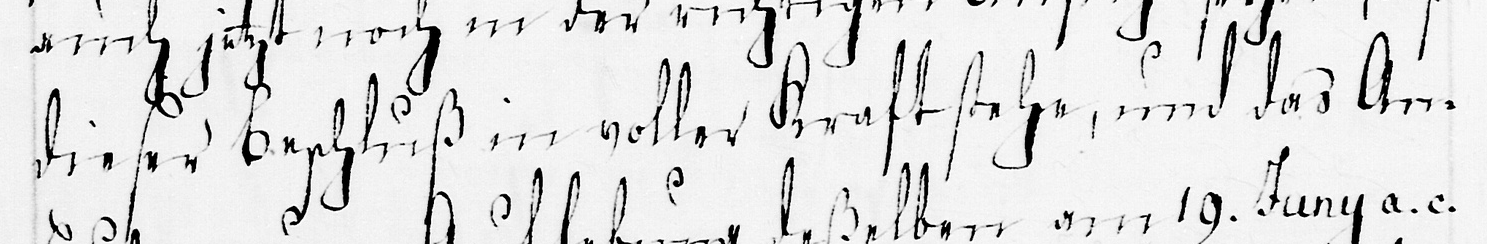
dieser Beschluß in voller Kraft stehe, und das An¬
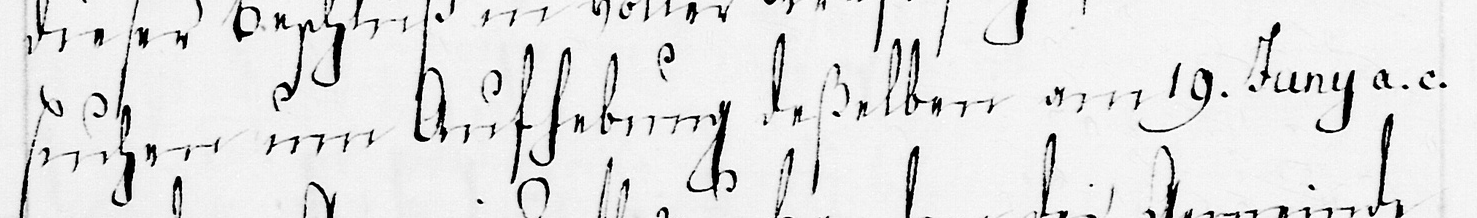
suchen um Aufhebung deßelben am 19. Juny a.
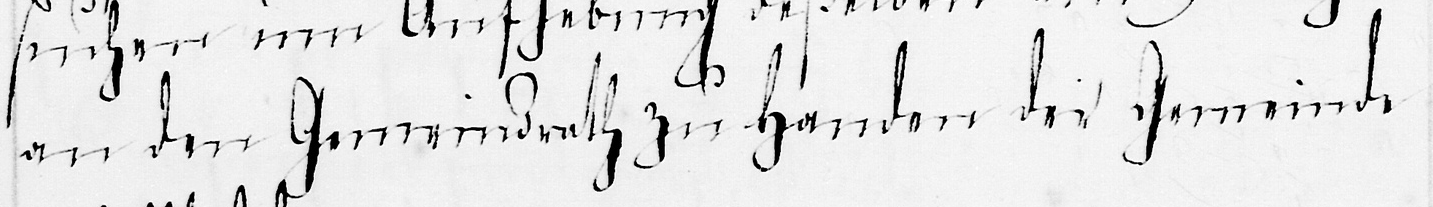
an den Gemeindrath zu Handen der Gemeinde
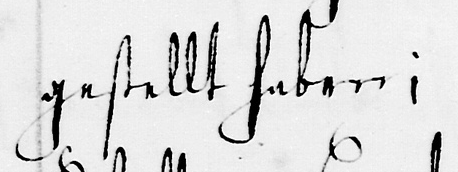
gestellt haben;
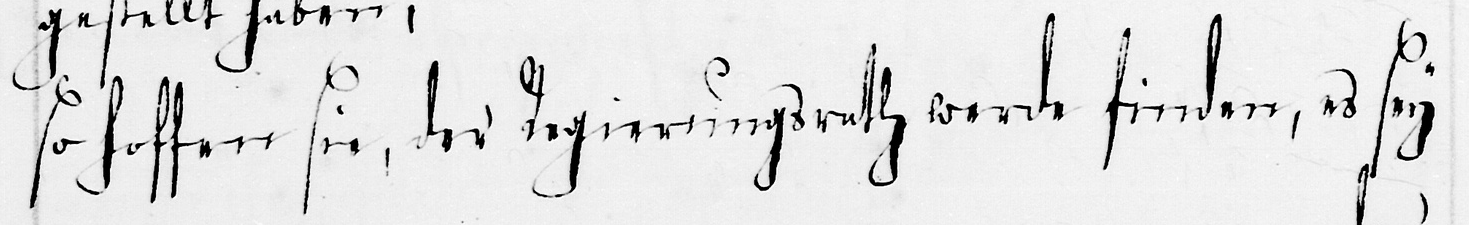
so hoffen sie, der Regierungsrath werde finden, es sey
